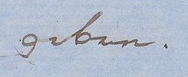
geben.
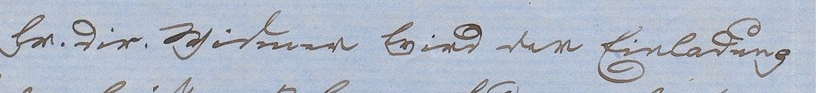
Hr. Dir. Widmer wird der Einladung
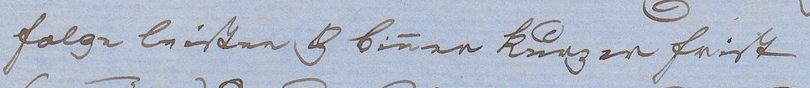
Folge leisten & binnen kurzer Frist
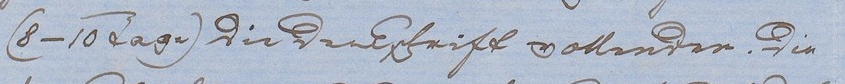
(8–10 Tage) die Denkschrift vollenden. Die
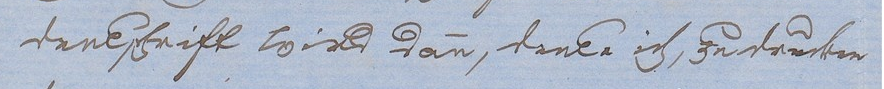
Denkschrift wird dann, denke ich, zu drucken
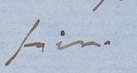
sein.
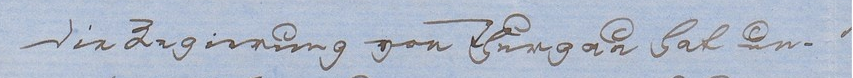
Die Regierung von Thurgau hat un-
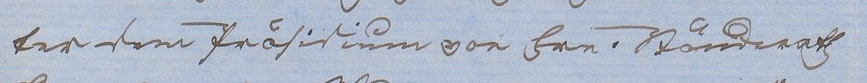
ter dem Präsidium von Hrn. Ständerath
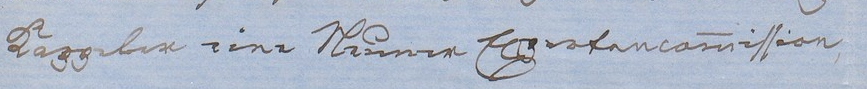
Kappeler eine Neuner Expertencommission,
